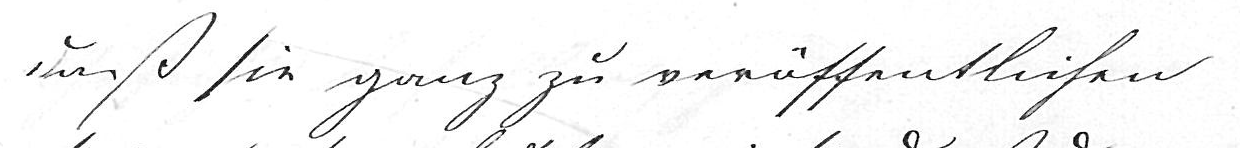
daß sie ganz zu veröffentlichen
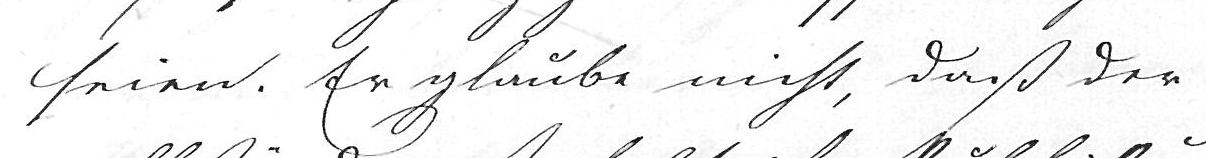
seien. Er glaube nicht, daß der
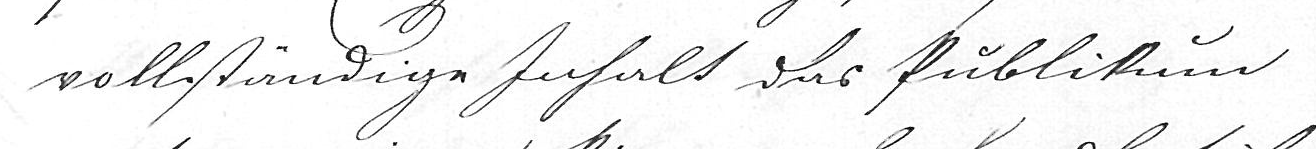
vollständige Inhalt das Publikum
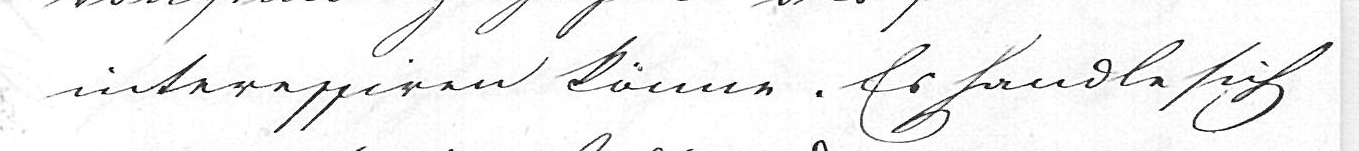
interessiren könne. Es handle sich
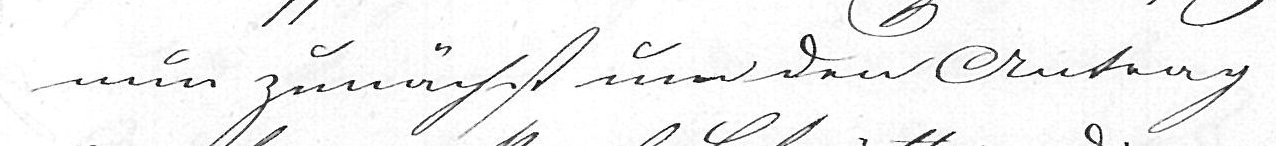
nun zunächst um den Antrag
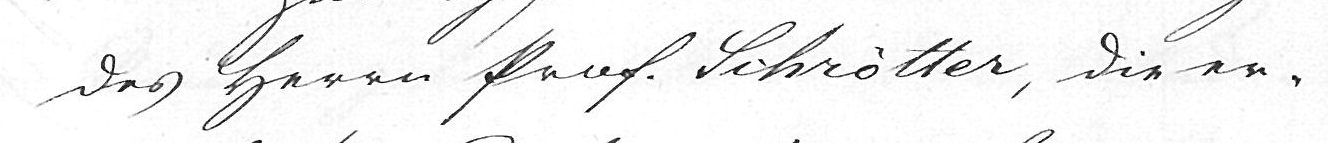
des Herrn Prof. Schrötter, die er-
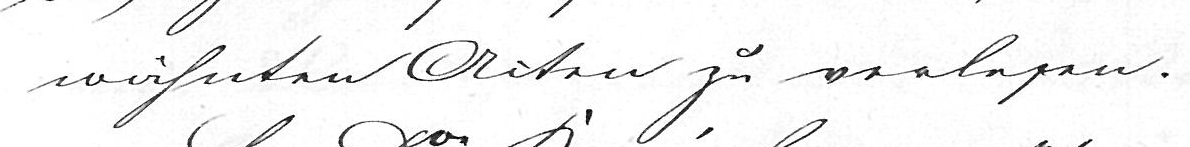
wähnten Acten zu verlesen.
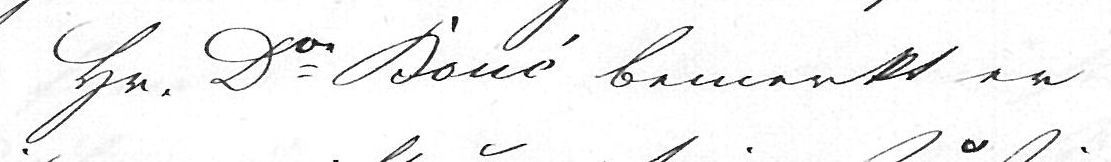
Hr. Dor Boué bemerkt er
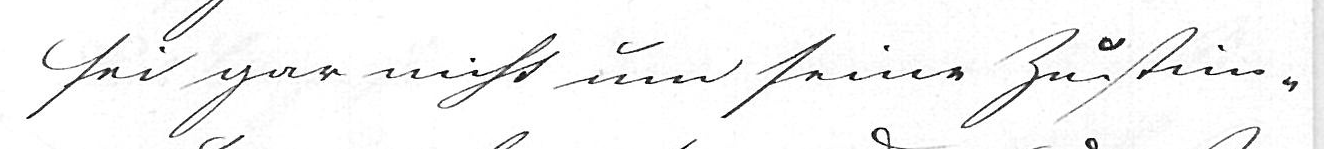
sei gar nicht um seine Zustim-
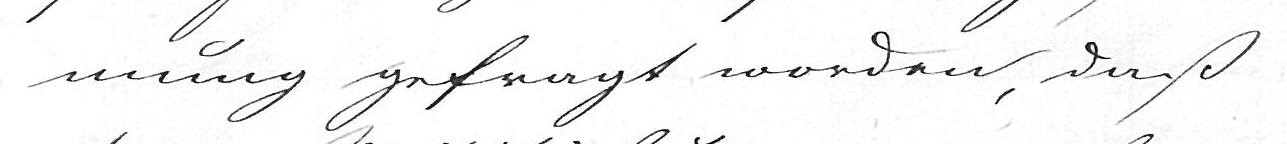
mung gefragt worden, daß
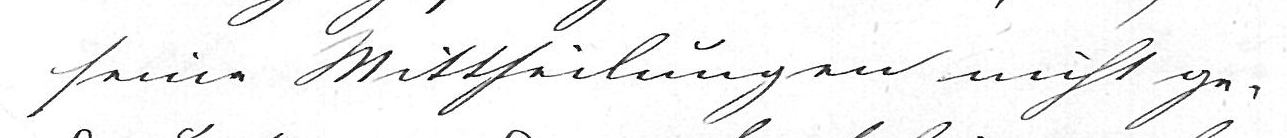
seine Mittheilungen nicht ge-
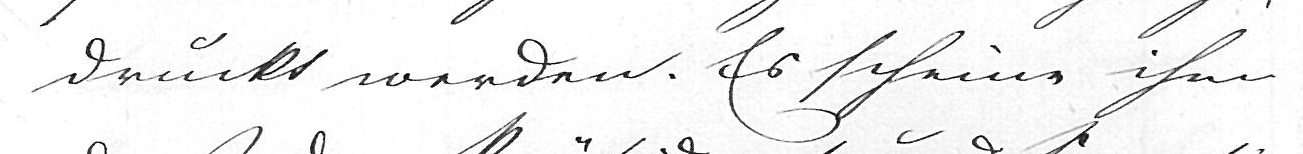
druckt werden. Es scheine ihm
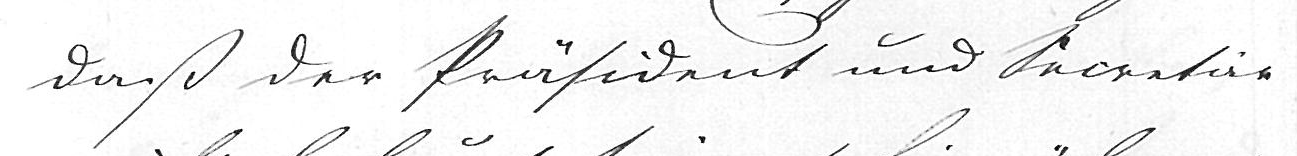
daß der Präsident und Secretär
